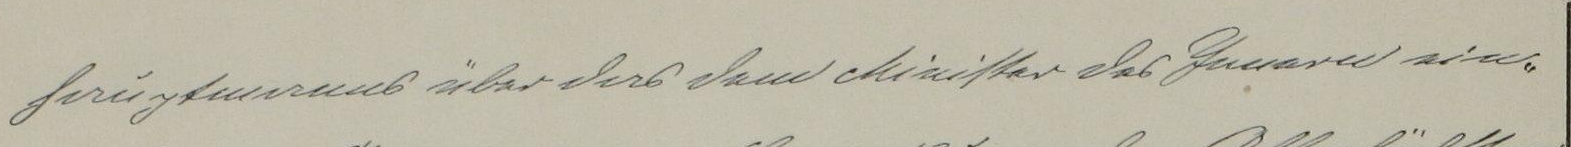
hauptmanns über das dem Minister des Innern ein-
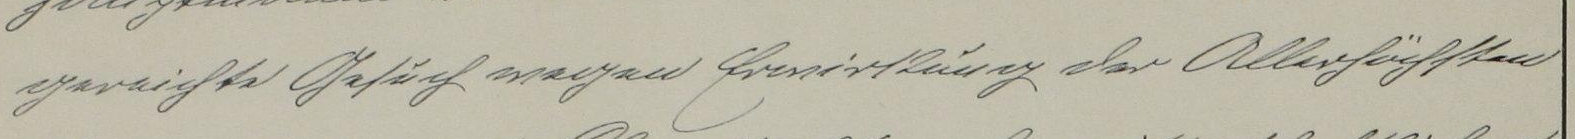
gereichte Gesuch wegen Erwirkung der Allerhöchsten
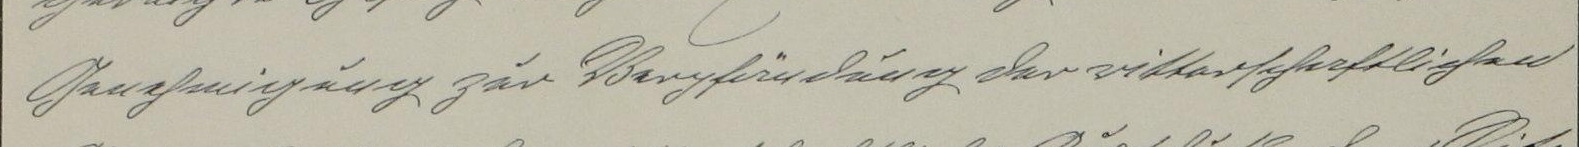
Genehmigung zur Verpfändung der ritterschaftlichen
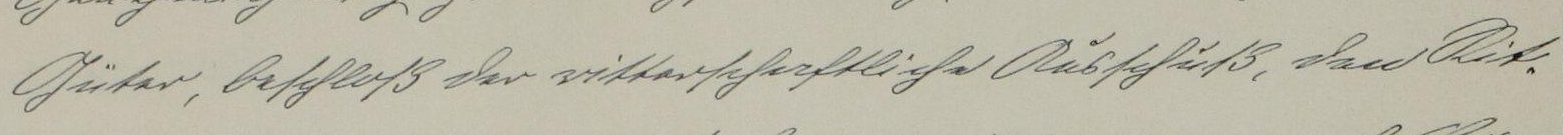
Güter, beschloß der ritterschaftliche Ausschuß, den Rit-
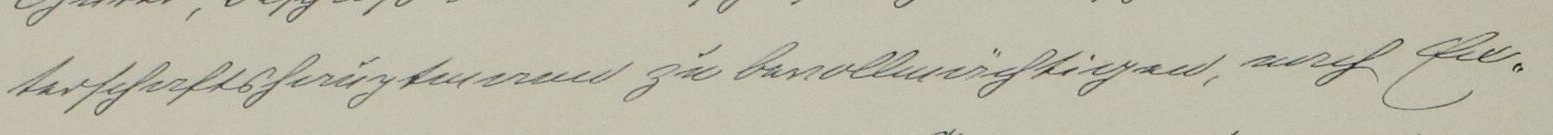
terschaftshauptmann zu bevollmächtigen, nach Ex-
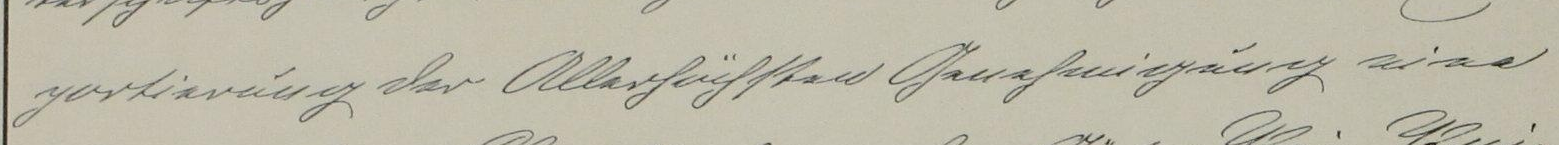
portierung der Allerhöchsten Genehmigung eine
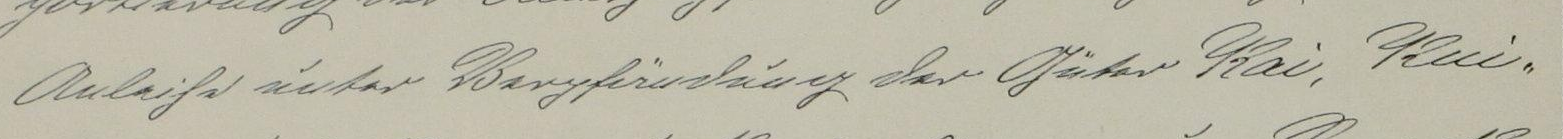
Anleihe unter Verpfändung der Güter Kai, Kui-
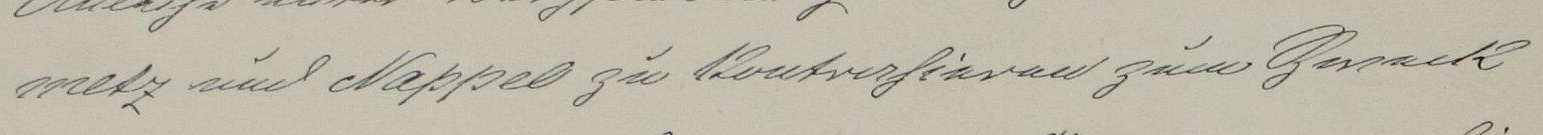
metz und Nappel zu kontrahieren zum Zweck
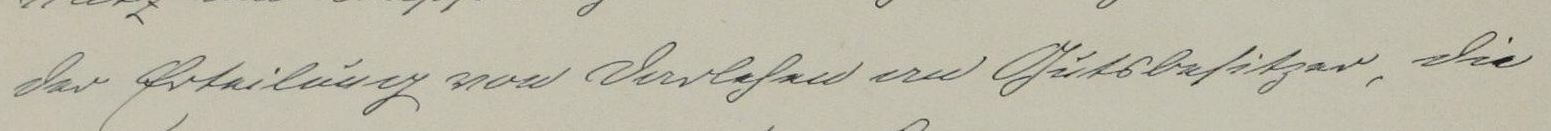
der Erteilung von Darlehen an Gutsbesitzer, die
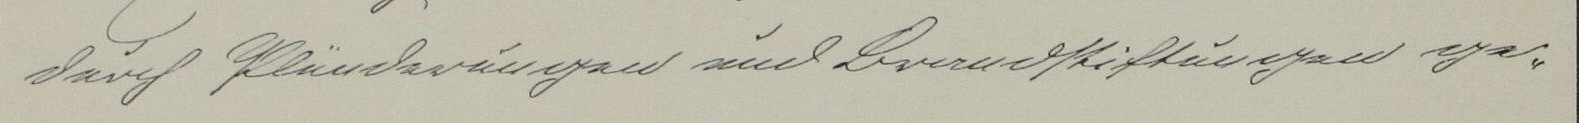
durch Plünderungen und Brandstiftungen ge-
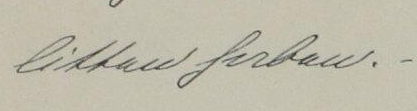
litten haben.
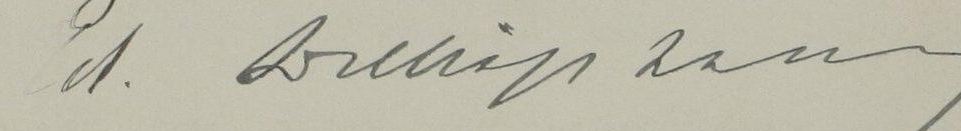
Ed. Dellingshausen
